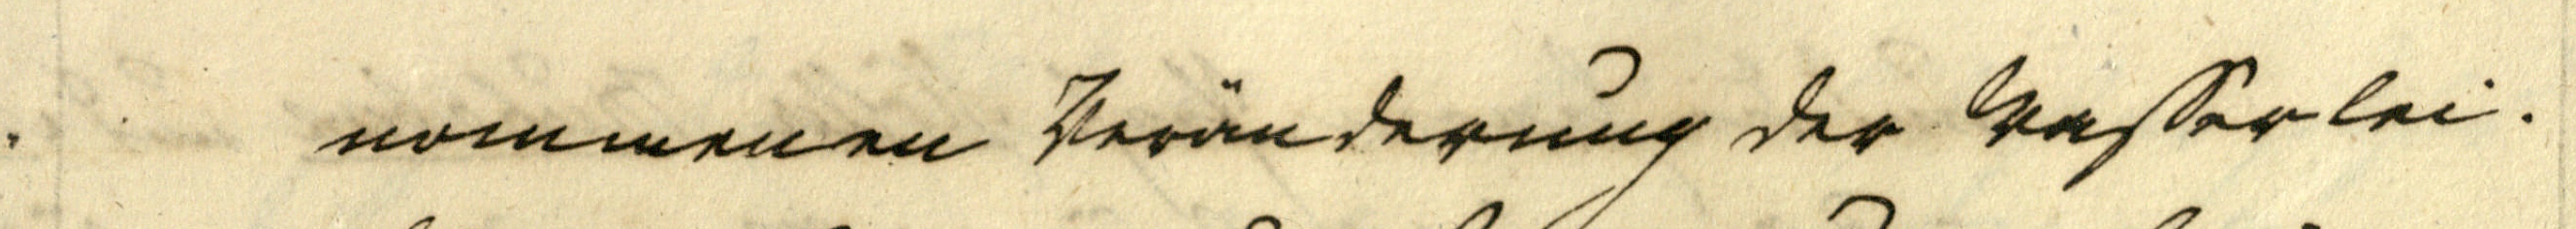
nommenen Veränderung der Wasserlei-
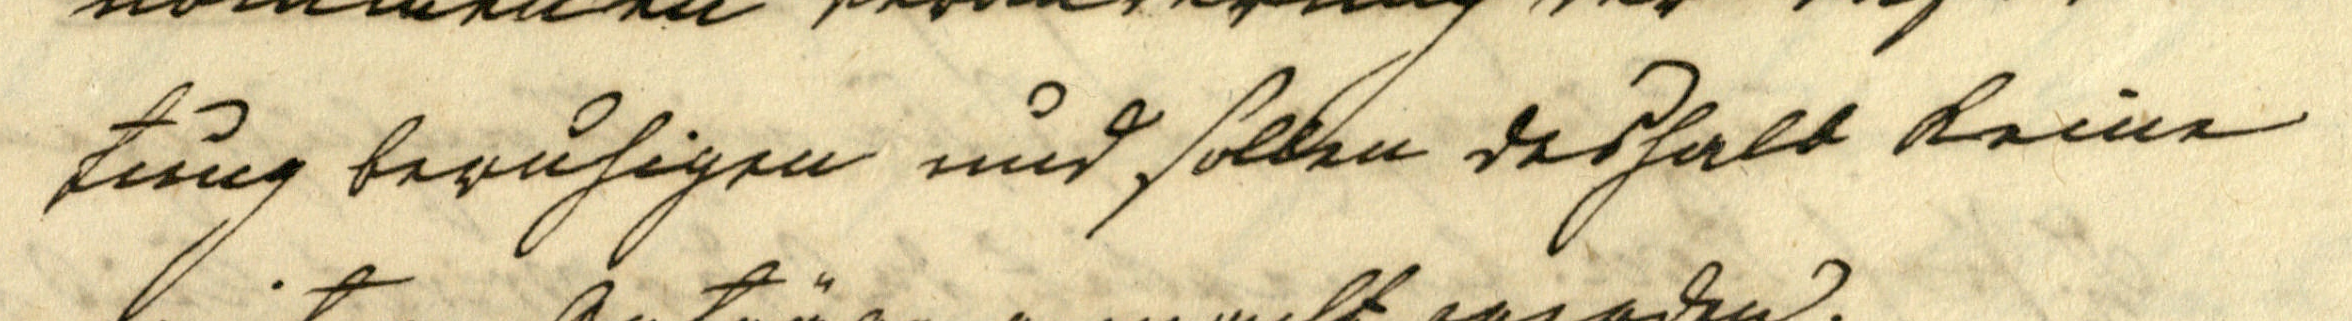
tung beruhigen und sollen deshalb keine
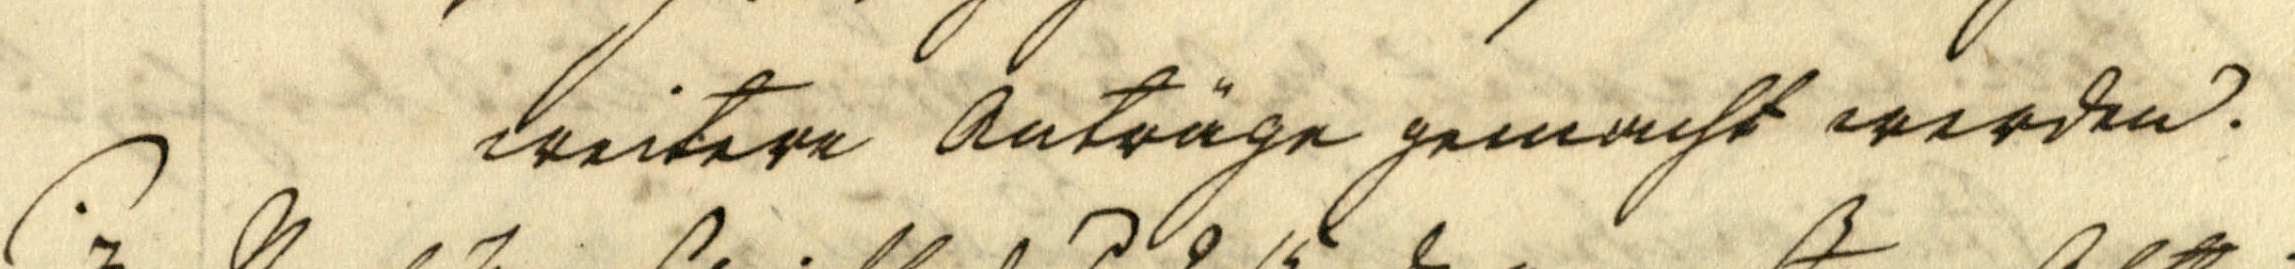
weitern Anträge gemacht werden.
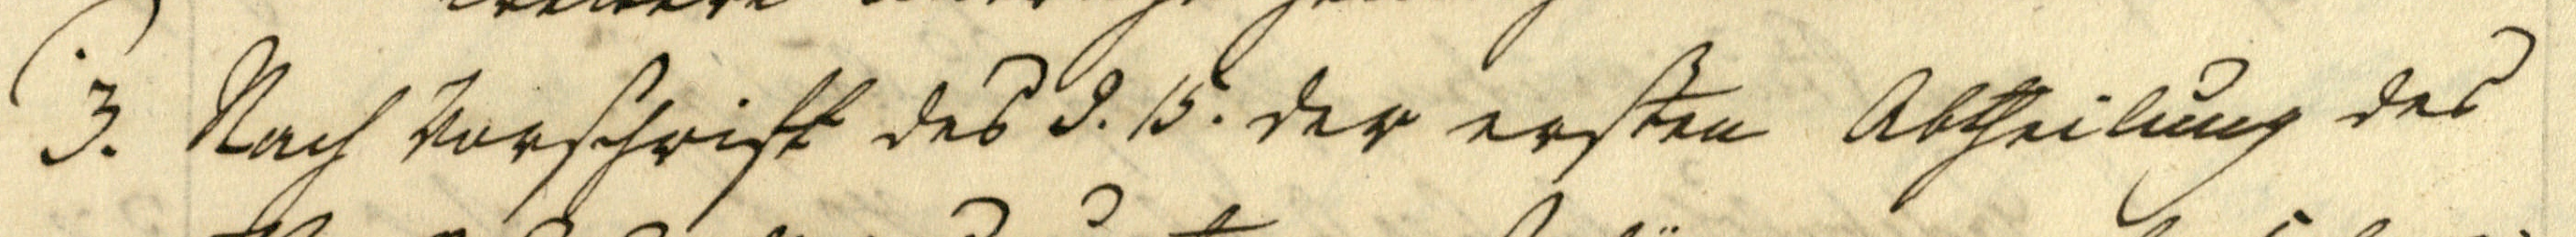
3. Nach Vorschrift des §. 15. der ersten Abtheilung des
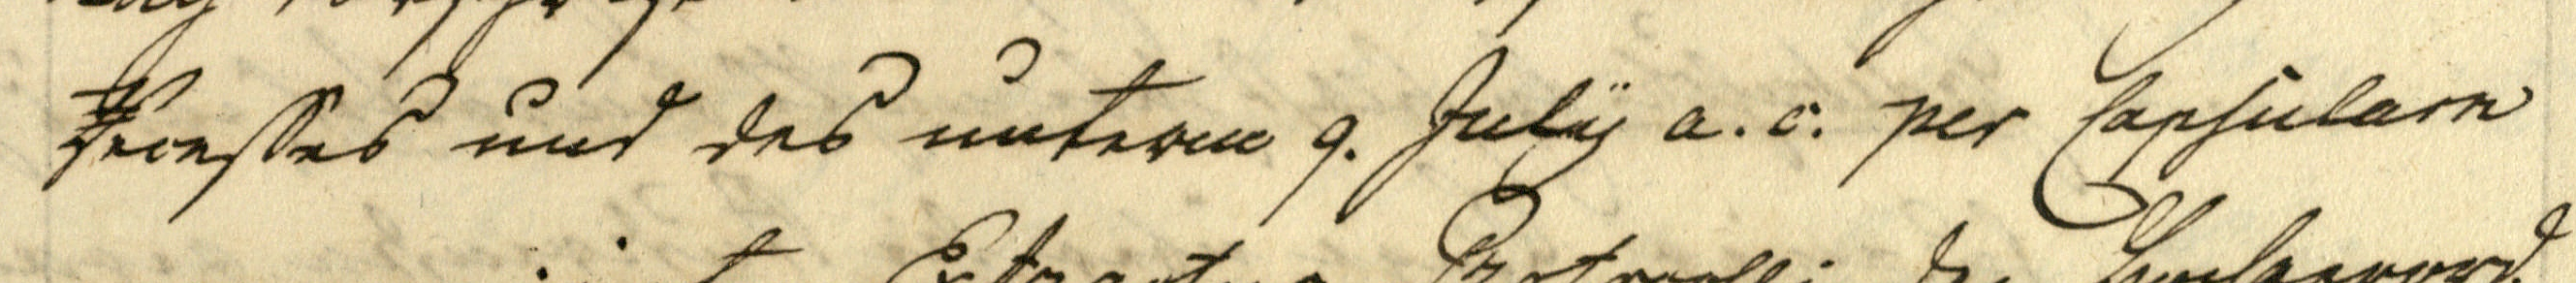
Recesses und des unterm 9. July a. c. per Capsulam
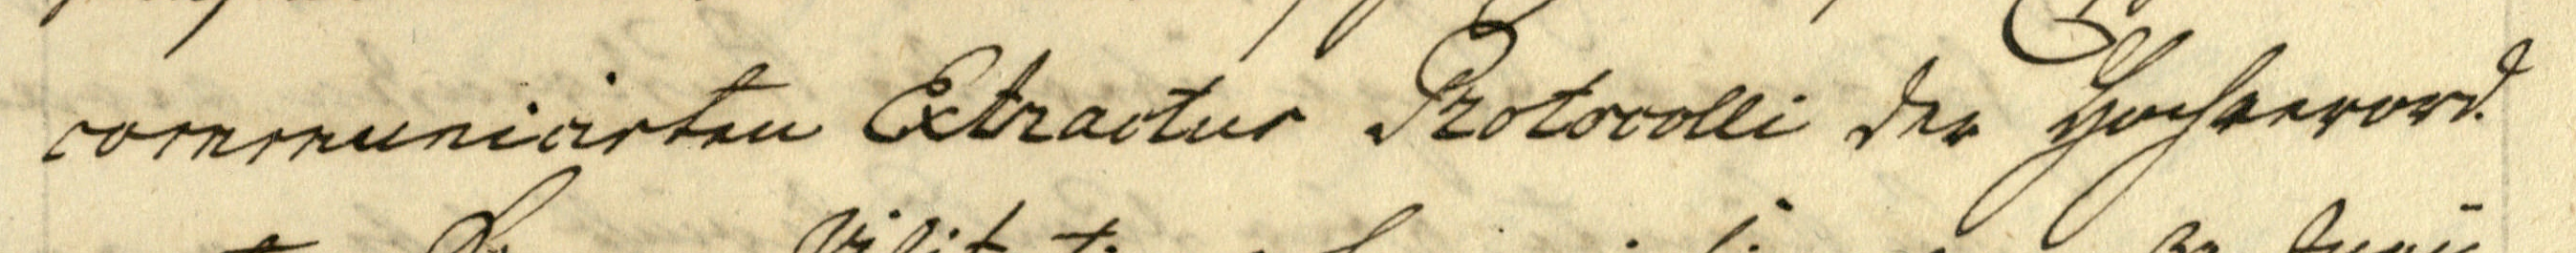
communicirten Extractus Protocolli der Hochverord-
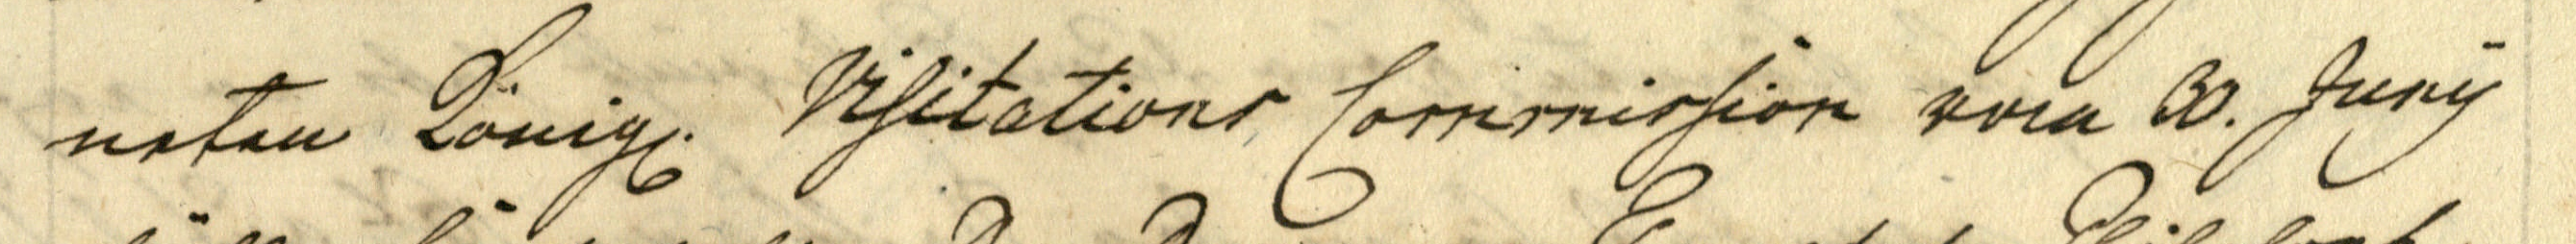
neten Königl. Visitations Commission vom 30. Juny
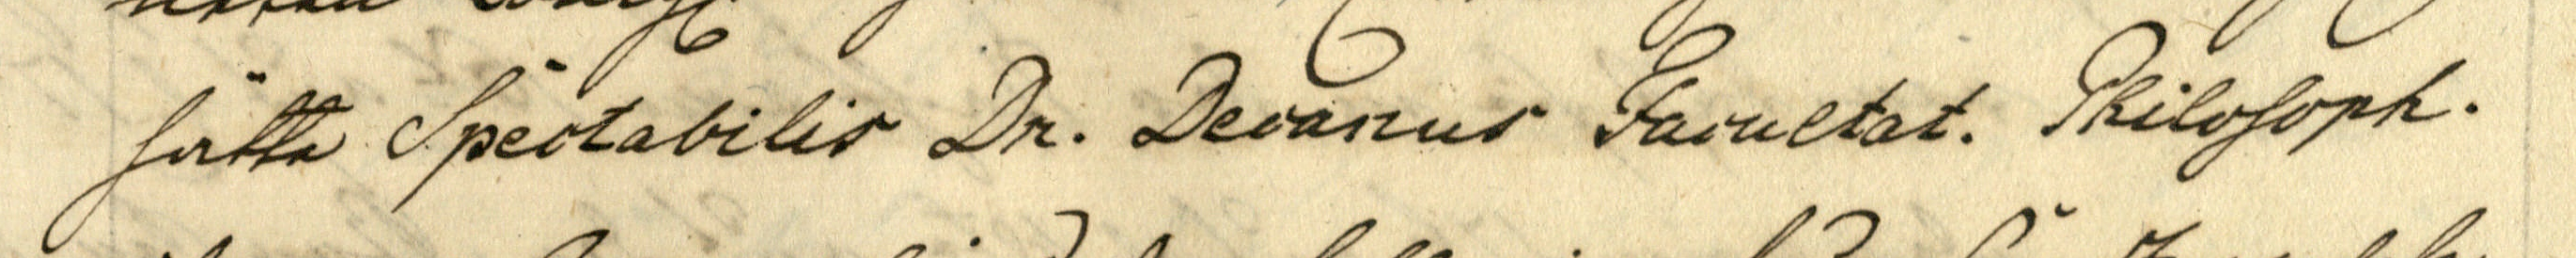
hätte Spectabilis Dn. Decanus Facultat. Philosoph.
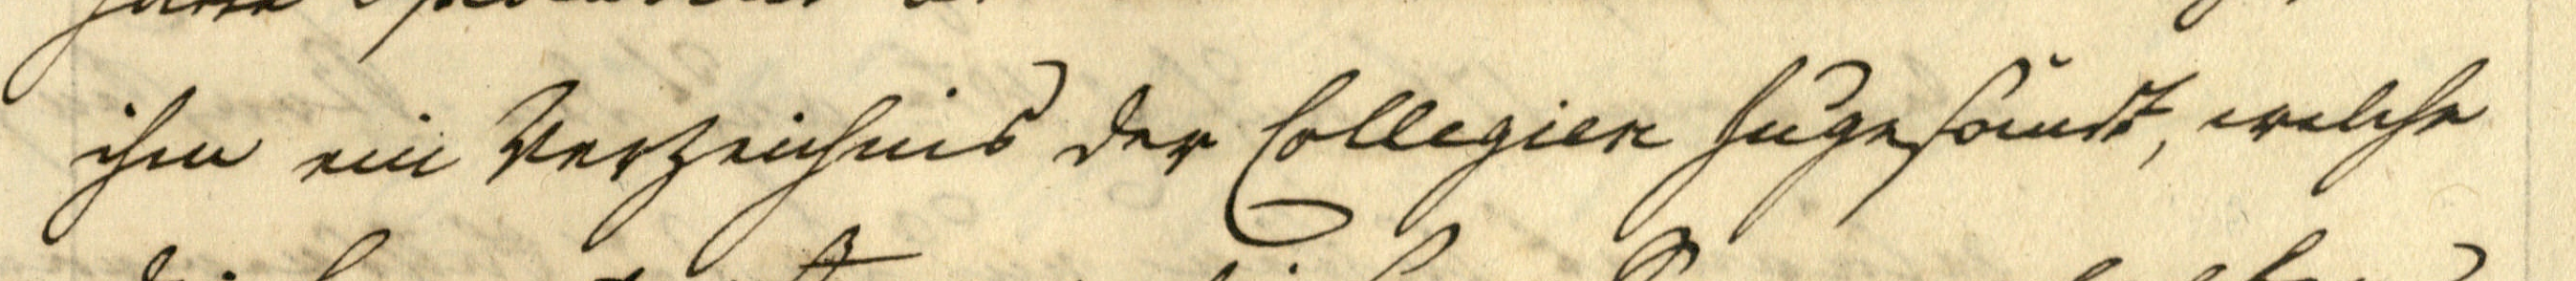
ihm ein Verzeichnis der Collegien zugesandt, welche
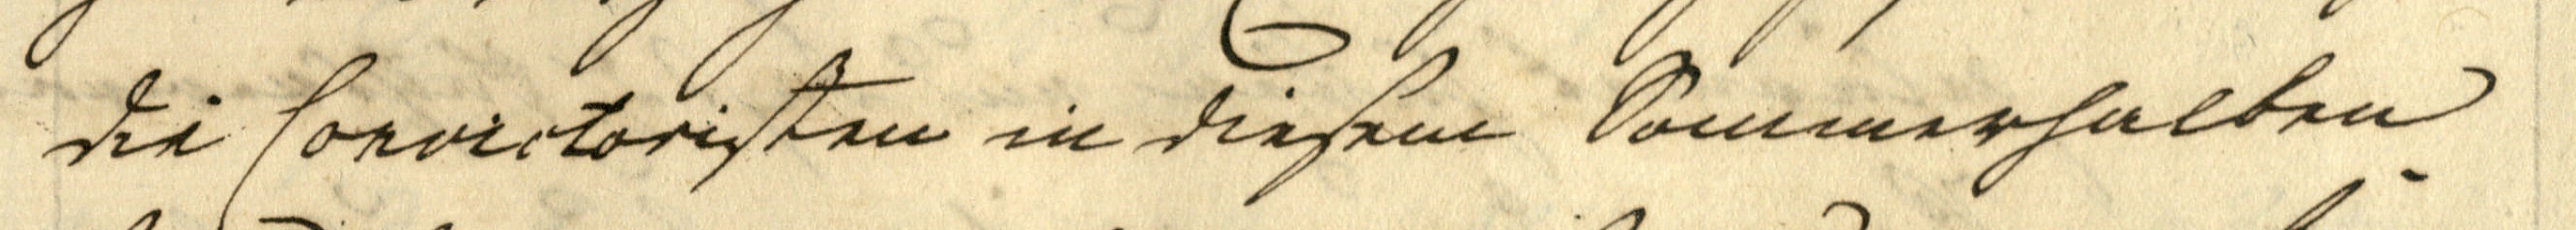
die Convictoristen in diesem Sommerhalben
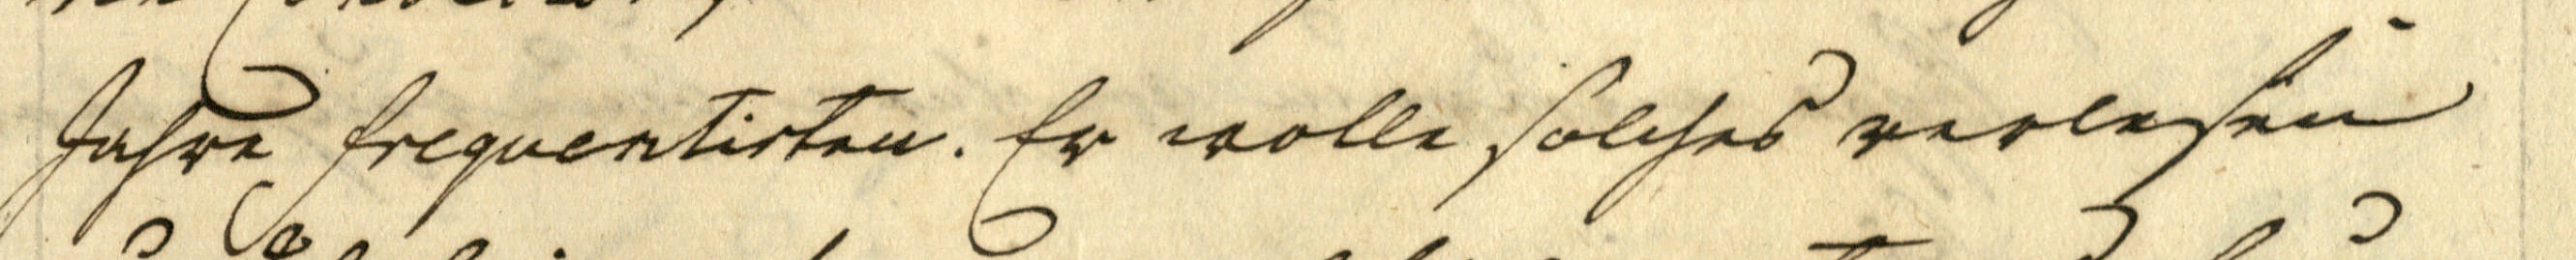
Jahre frequentirten. Er wolle solches verlesen
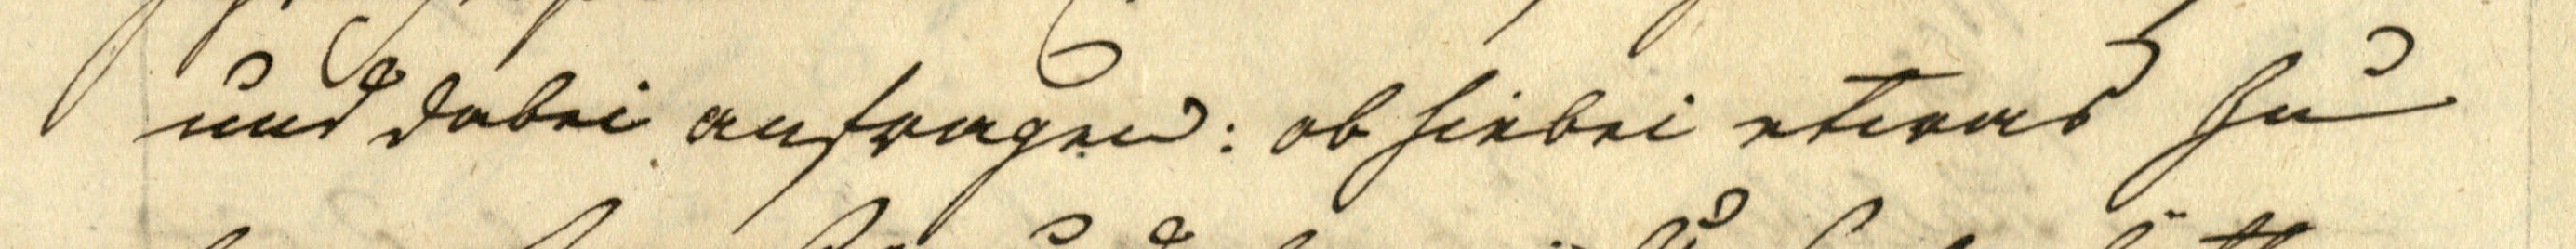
und dabei anfagen: ob hiebei etwas zu
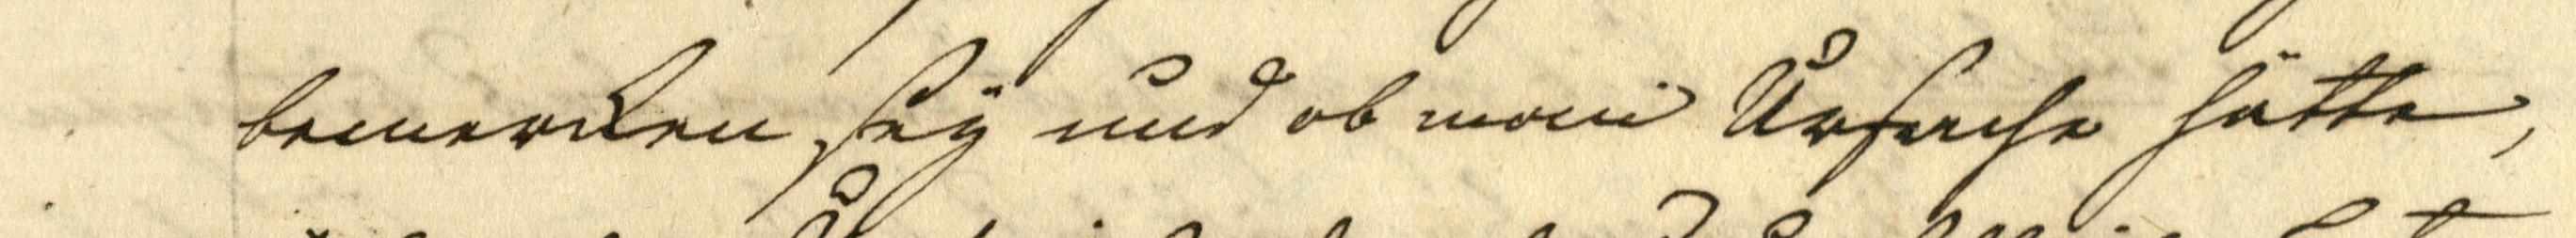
bemerken sey und ob man Ursache hätte,
